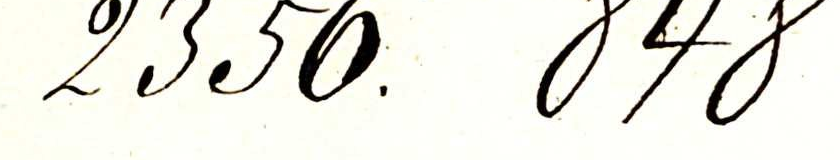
2356 [1]848
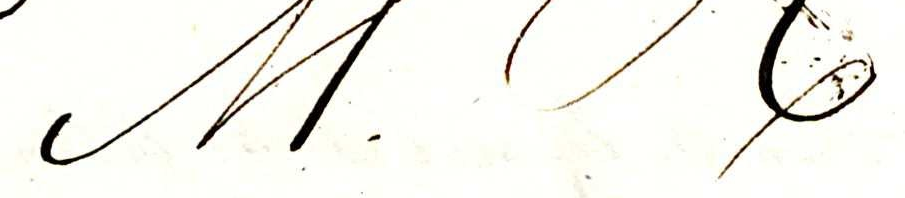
MR
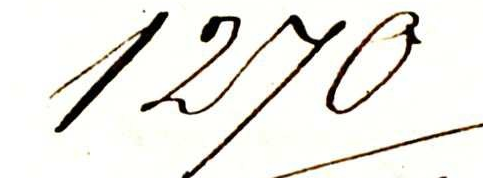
1270
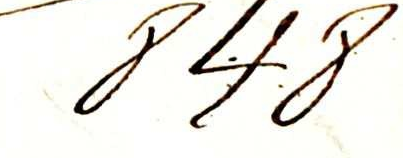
/848
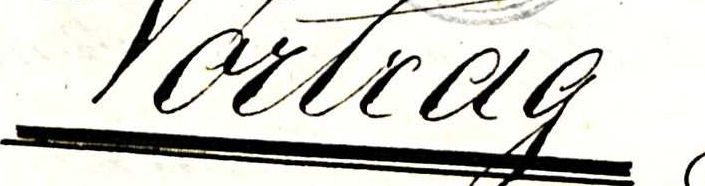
Vortrag
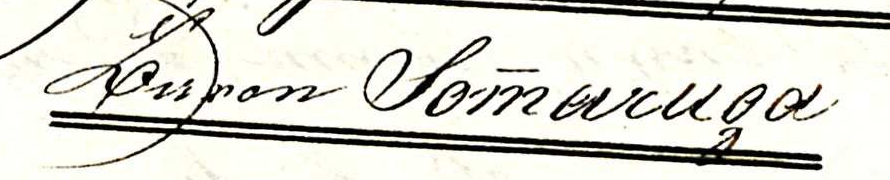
Baron Sommaruga
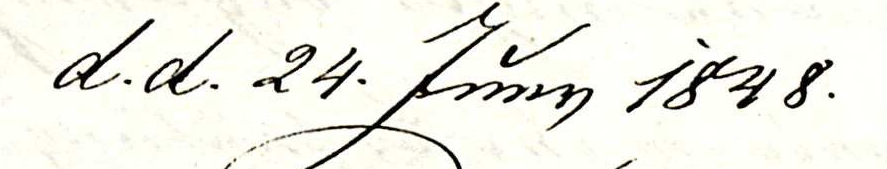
d.d. 24 Juny 1848
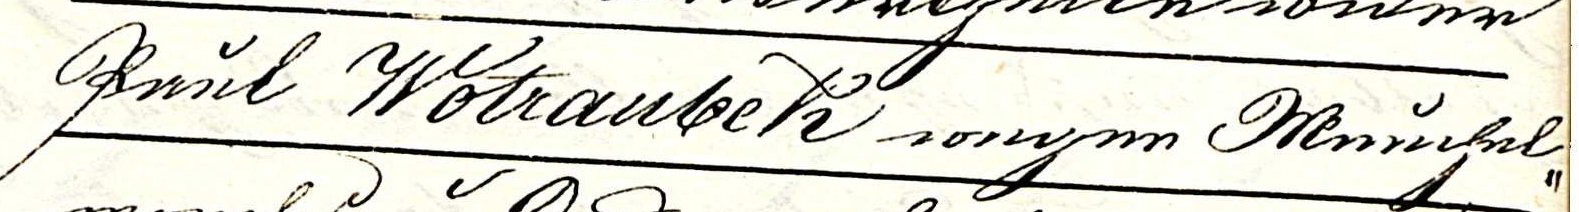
Paul Wotraubek wegen Meuchel¬
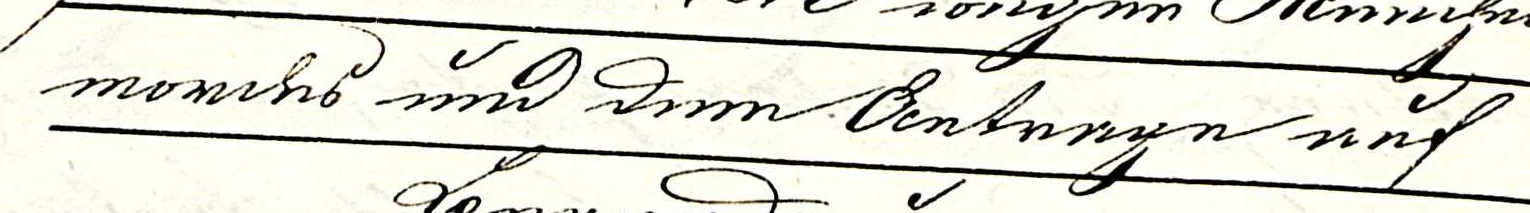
mordes und dem Antrage auf
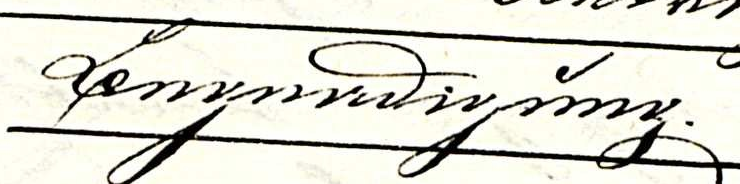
Begnadigung
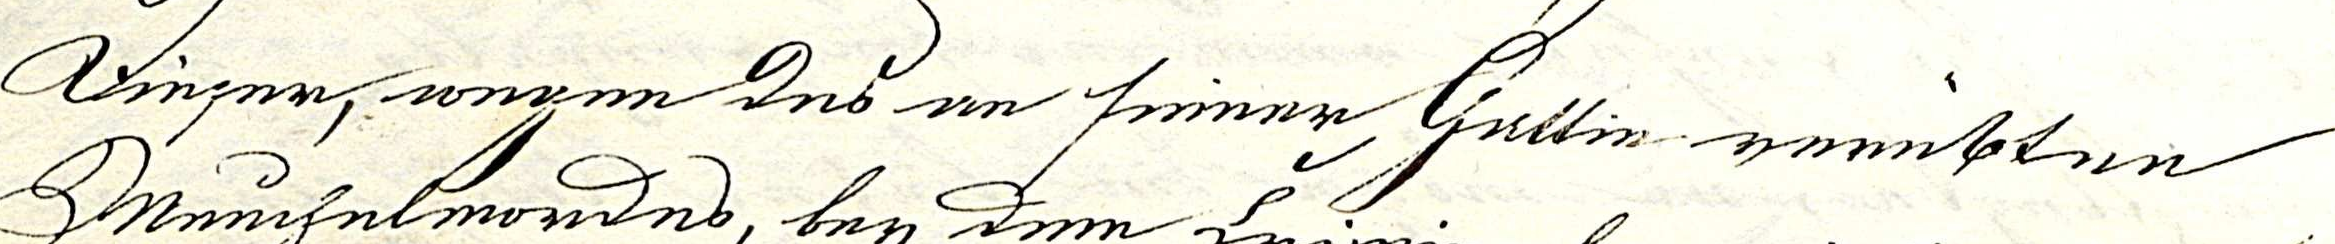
Dieser, wegen des an seiner Gattin verübten
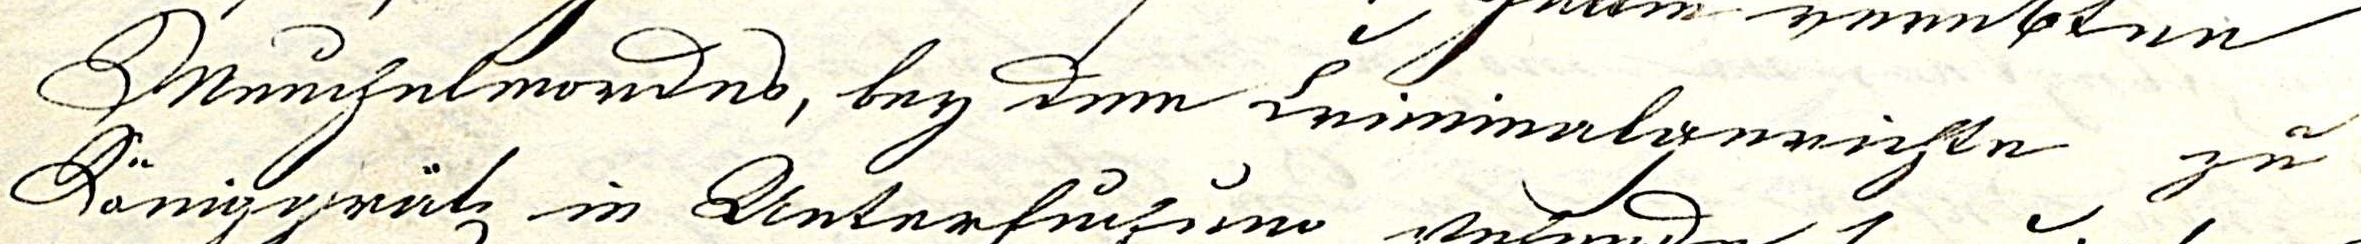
Meuchelmordes, bey dem Criminalgerichte zu
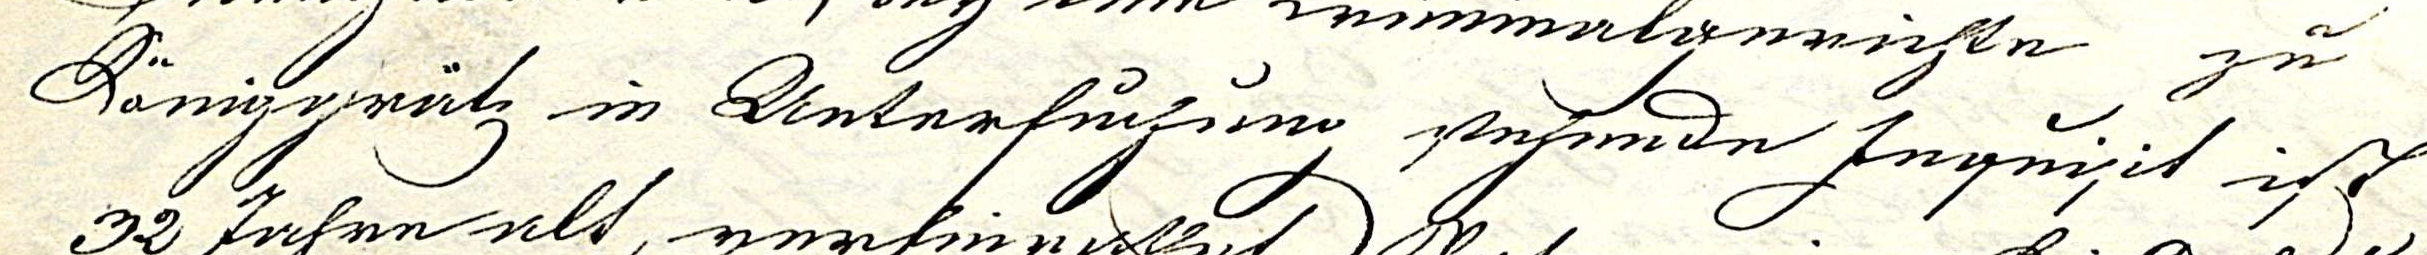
Königgrätz in Untersuchung stehende Inquisit ist
